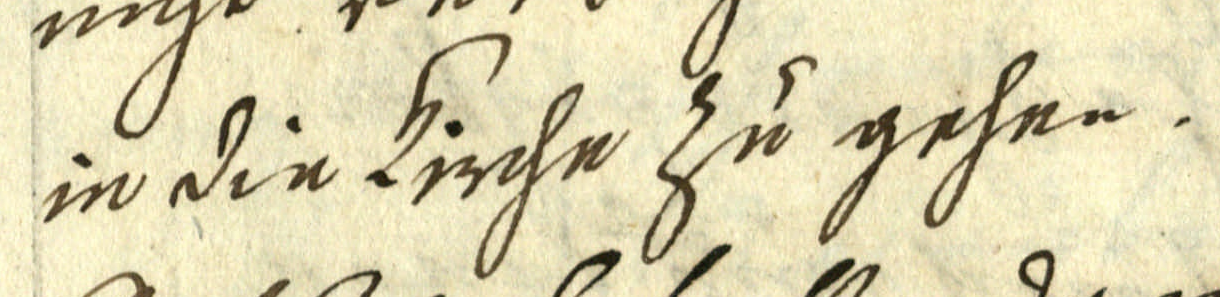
in die Kirche zu gehen.
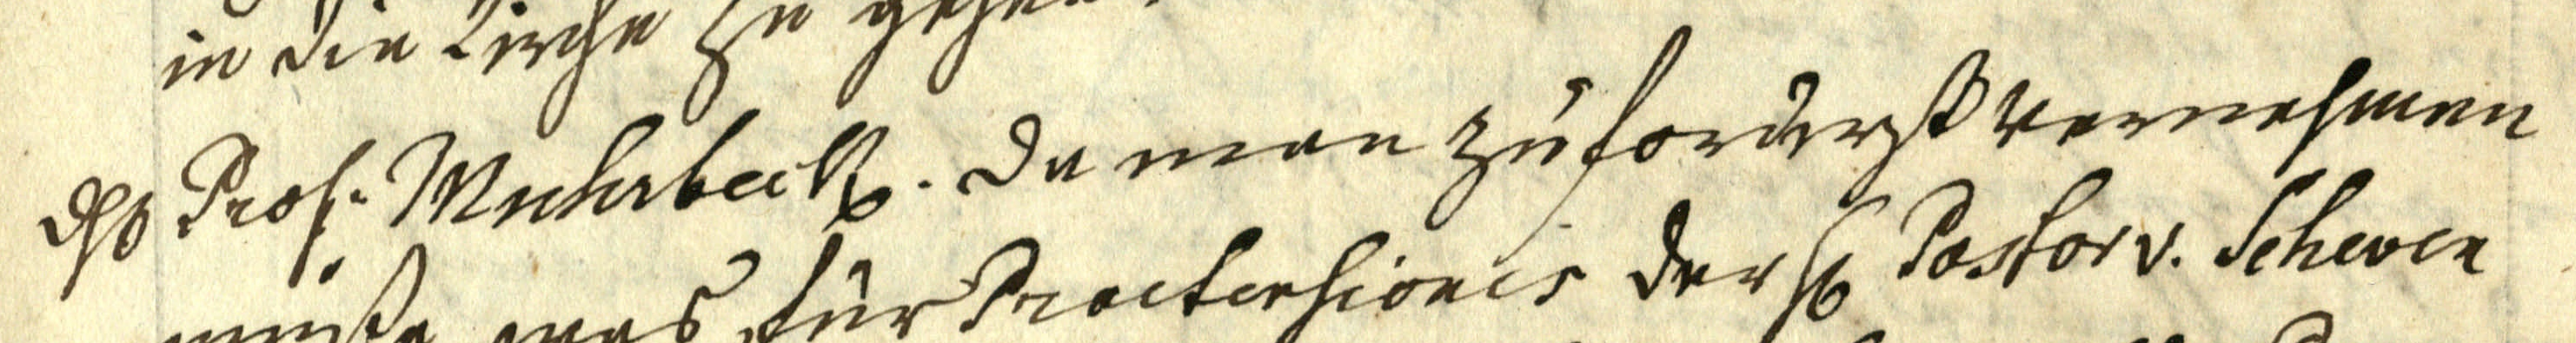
dh Prof. Muhrbeck. Da man zuforderst vernehmen
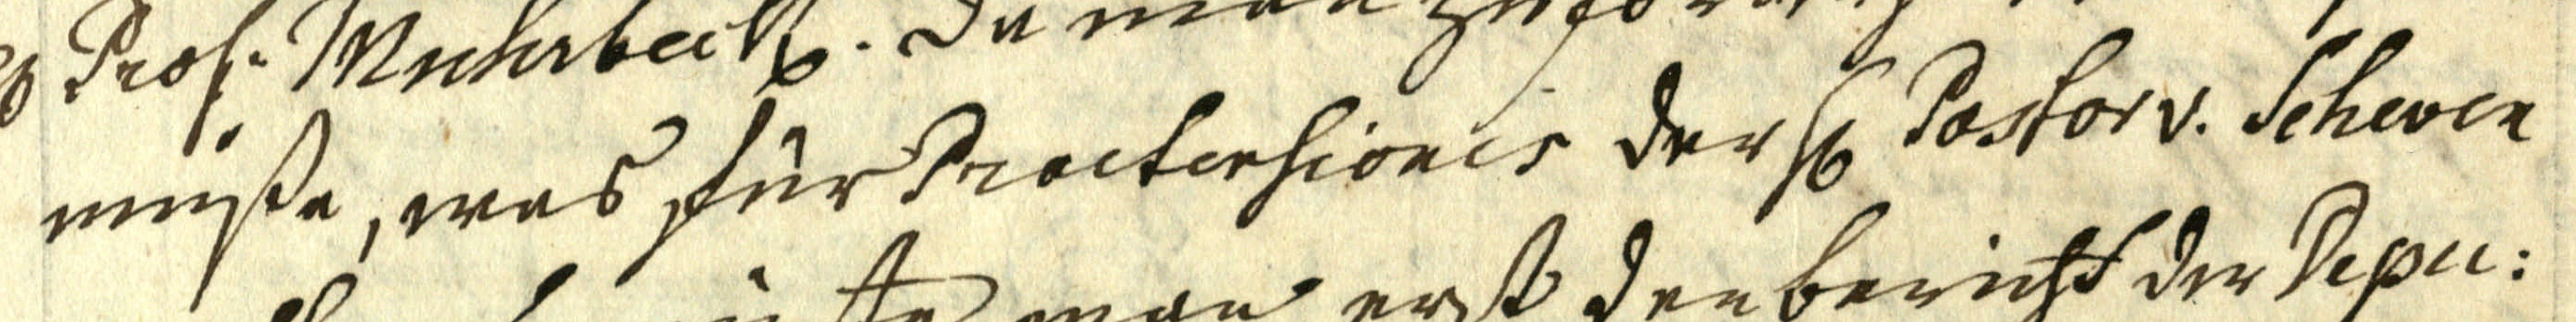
müße, was für Praetensionis der h. Pastor v. Scheven
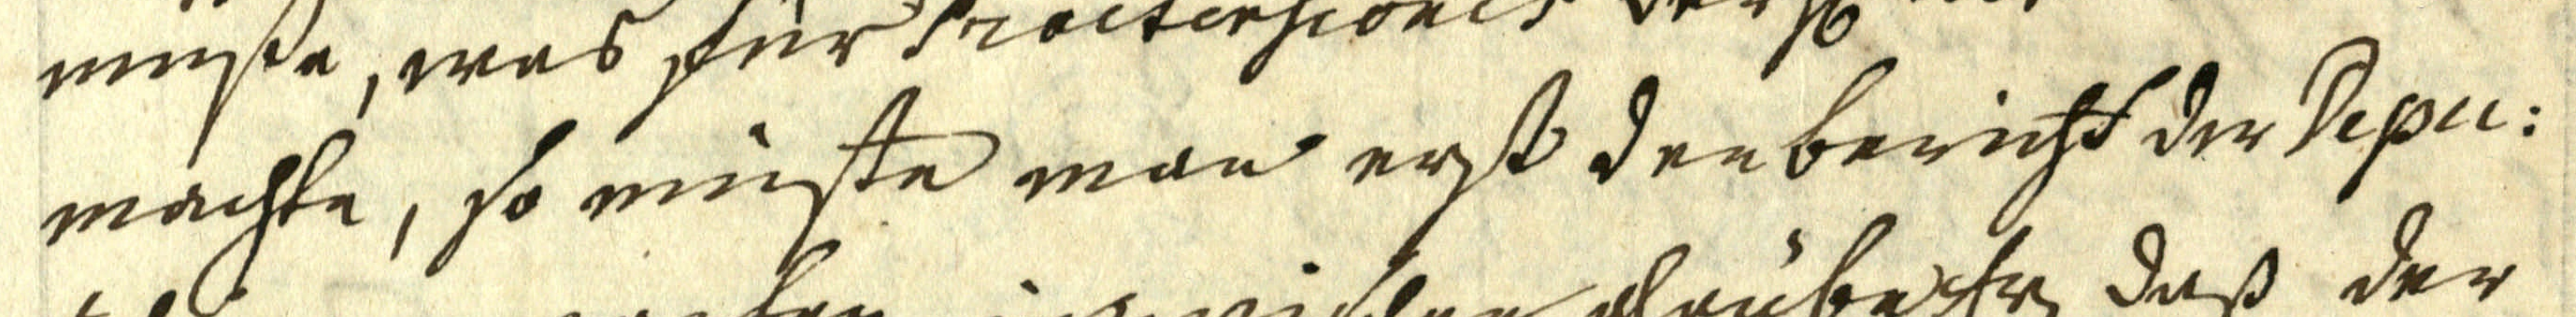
machte, so müste man erst den Bericht der Depu¬
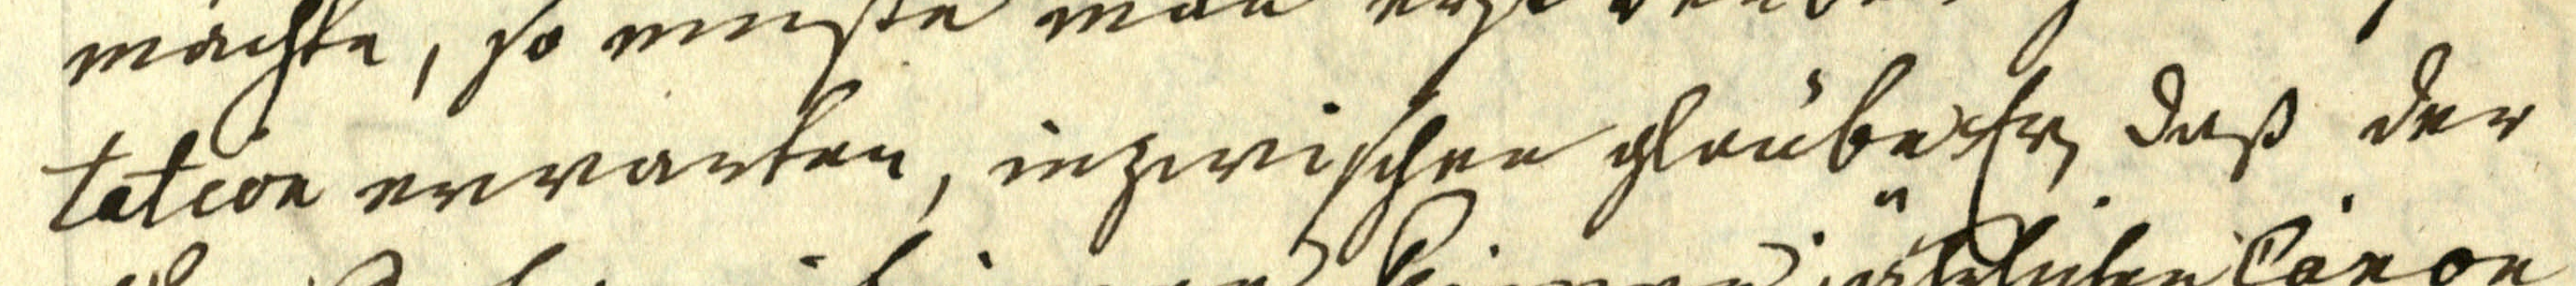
tation erwarten, inzwischen glaube Er, daß der
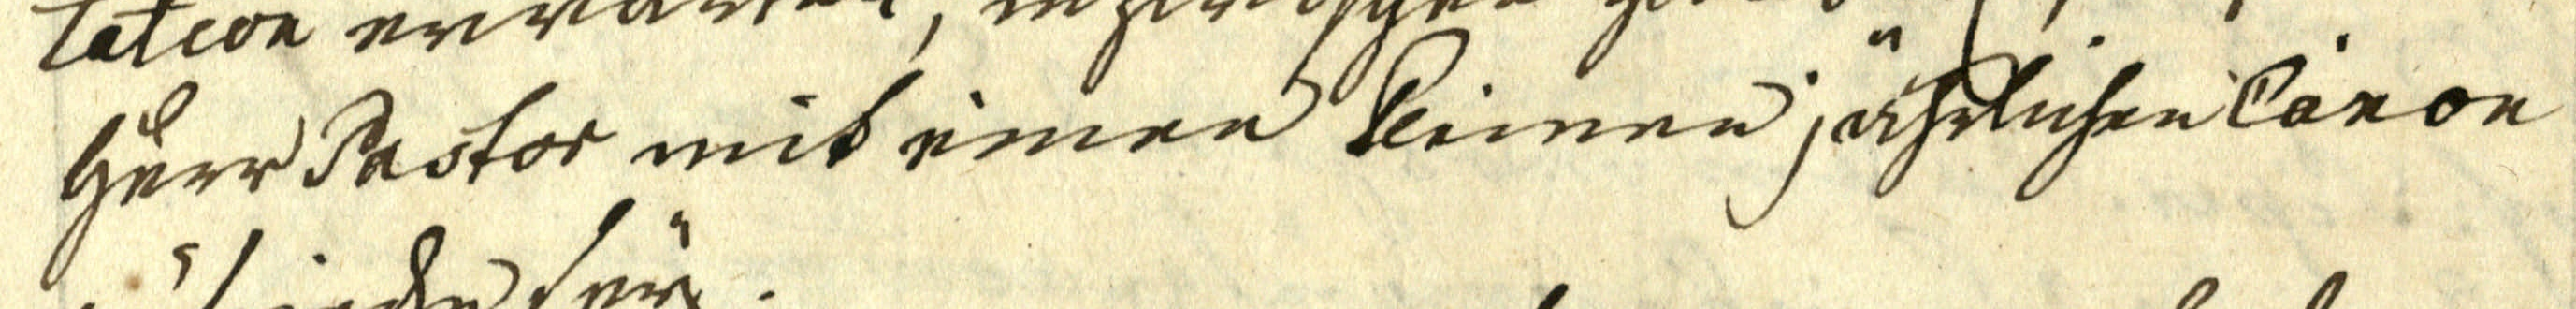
Herr Pastor mit einen kleinen jährlichen Canon
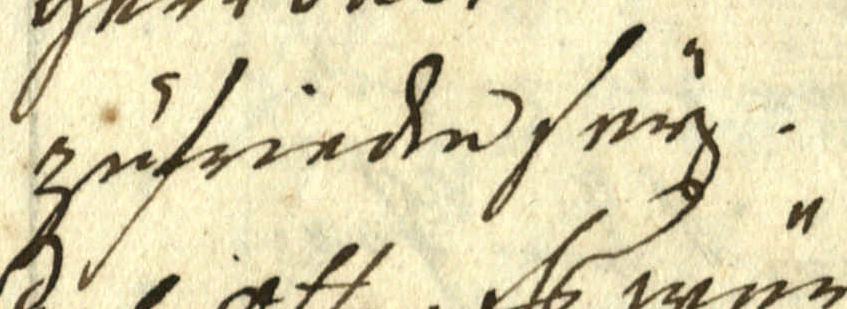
zufrieden seÿ.
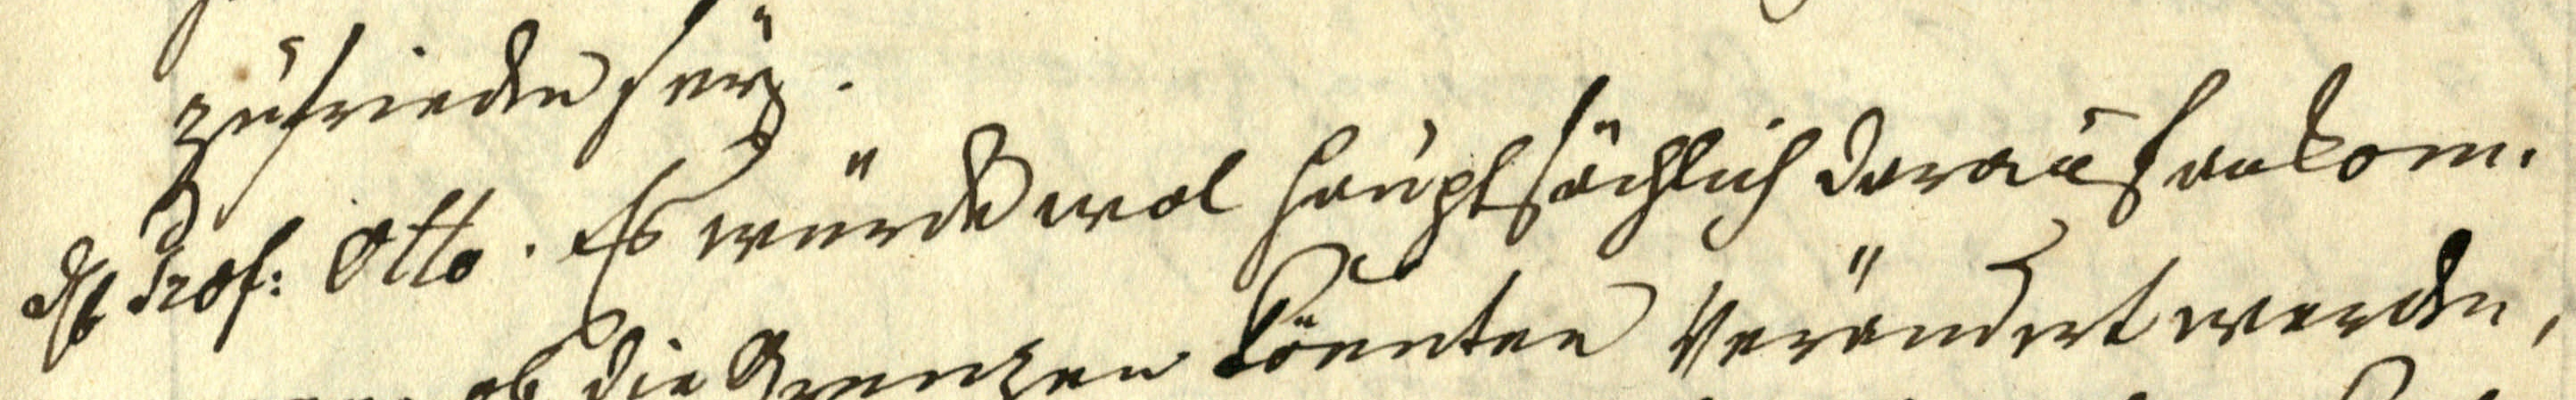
dh Prof. Otto. Es würde wol hauptsächlich darauf ankom¬
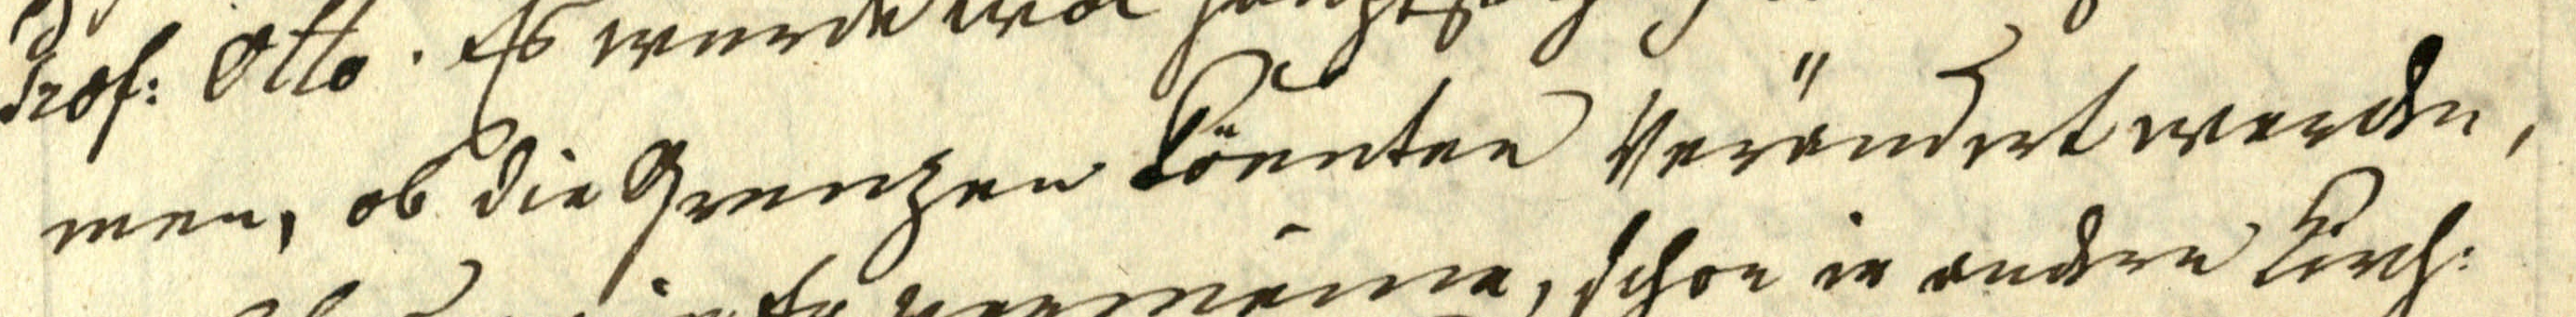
men, ob die Grenzen könnten verändert werden,
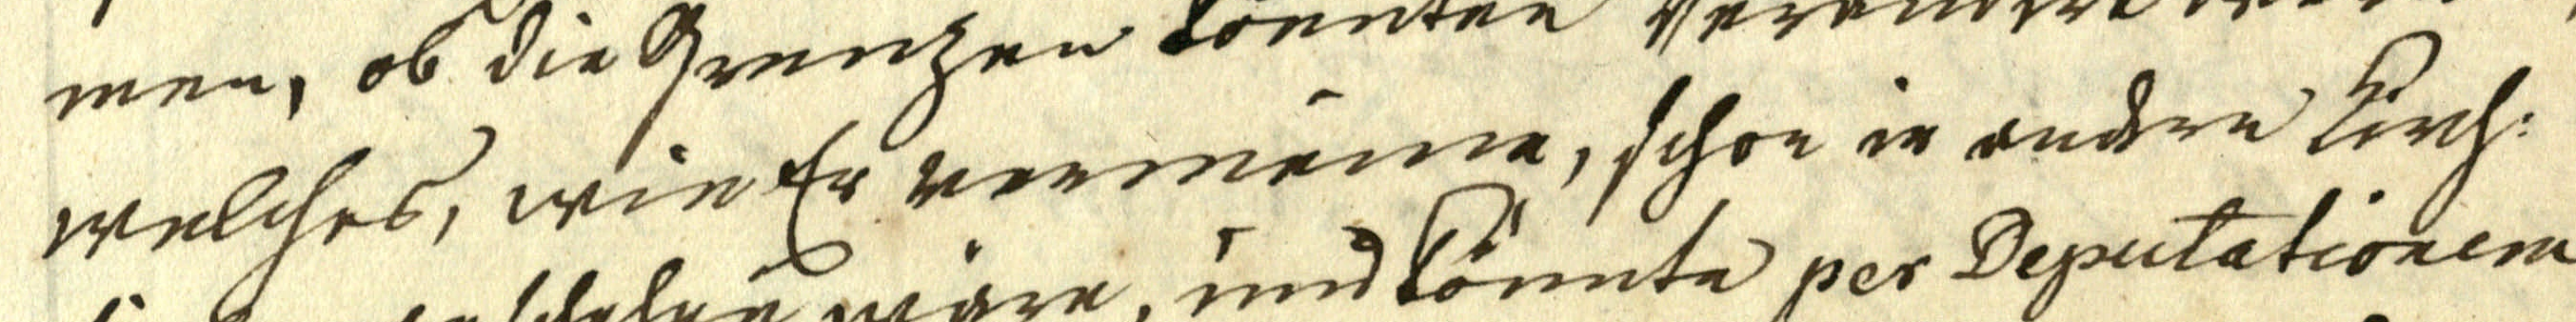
welches, wie Er vermeine, schon in andern Kirch¬
